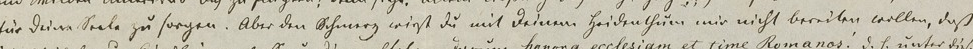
für Deine Seele zu sorgen. Aber den Schmerz wirst Du mit Deinem Heidenthum mir nicht bereiten wollen, daß
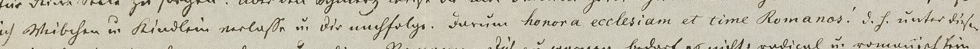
ich Weibchen u. Kindlein verlasse u. Dir nachfolge. Darum honora ecclesiam et time Romanos! d. h. unter diesen
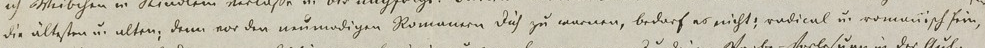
die ältesten u. alten; denn vor den neumodigen Romanern Dich zu warnen, bedarf es nicht; radical u. romannisch sein,
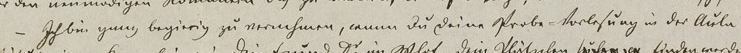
– Ich bin ganz begierig zu vernehmen, wann Du Deine Probe- Vorlesung in der Aula
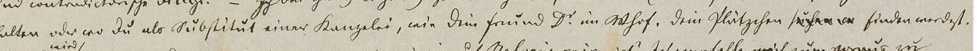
halten oder wo Du als Substitut einer Kanzelei, wie Dein Freund Dr im Whof. Dein Plätzchen suchenw finden werdest.
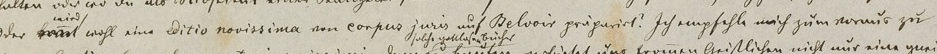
Oder kommtwird wohl editio novissima von corpus juris auf Belvoir präparirt? Ich empfehle mich zum voraus zu
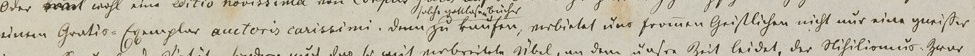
einem Gratis-Exemplar auctoris carissimi. Denn solche gottlosen Bücher zu kaufen, verbietet uns frommen Geistlichen nicht nur eine gewisser
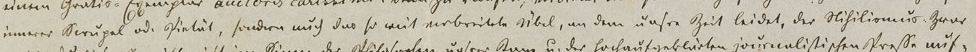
innerer Scrupel od. Pietät, sondern auch das so weit verbreitete Übel, an dem unsre Zeit leidet, der Nihilismus. Zwar
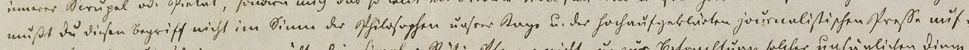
mußt Du diesen Begriff nicht im Sinne der Philosophen unsrer Tage u. der hochaufgeklärten journalistischen Presse auf-
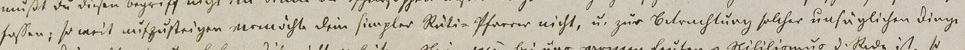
fassen; so weit aufzusteigen vermöchte Dein simpler Rüti-Pfarrer nicht, u. zur Betrachtung solcher unsäglichen Dinge
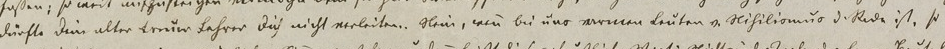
dürfte Dein alter treuer Lehrer Dich nicht verleiten. Nein, wenn bei uns armen Leuten v. Nihilismus d. Rede ist, so
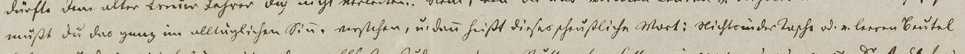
mußt Du das ganz im alltäglichen Sinne verstehen, u. dann heißt dieses scheußliche Wort: Nichts in der Tasche od.e. leeren Beutel
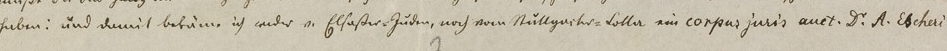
haben: und damit bekäme ich weder v. Elsaßer-Juden, noch vom Stuttgarter-Cotta ein corpus juris auct. Dr A. Escheri.
